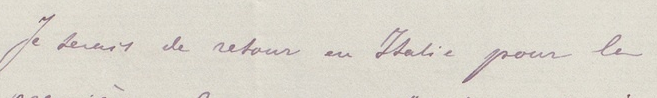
Je serais de retour en Italie pour la
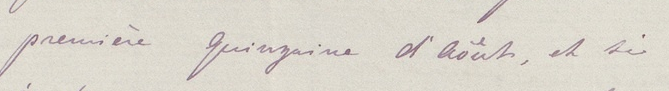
première Quinzaine d'Août, et si
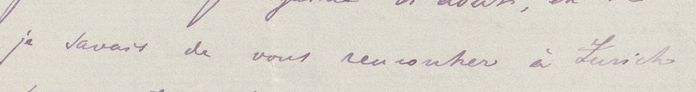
je savais de vous rencontrer à Zurich
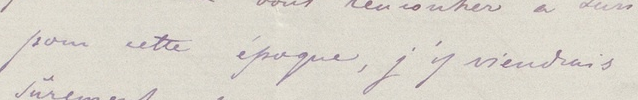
pour cette époque, j'y viendrais
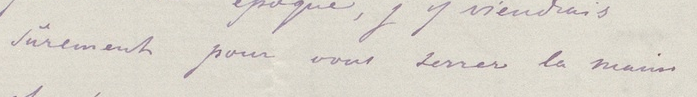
sûrement pour vous serrer la main
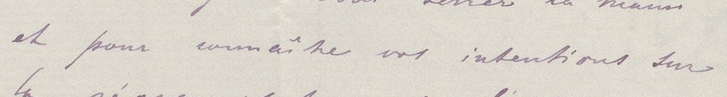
et pour connaître vos intentions sur
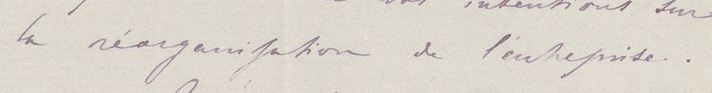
la réorganisation de l'entreprise.
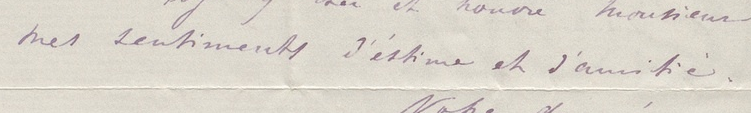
mes sentiments d'estime et d'amitié.
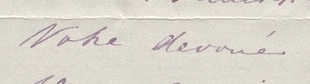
Votre devoué
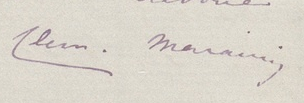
Clem. Maraini
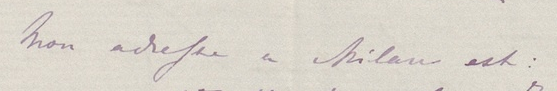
Mon adresse a Milan est:
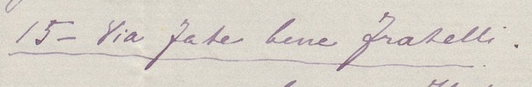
15 – Via Fate bene Fratelli.
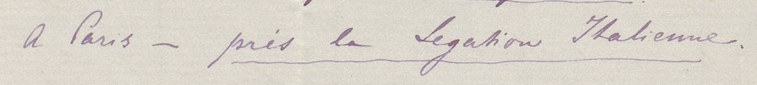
A Paris – près la Legation Italienne.
